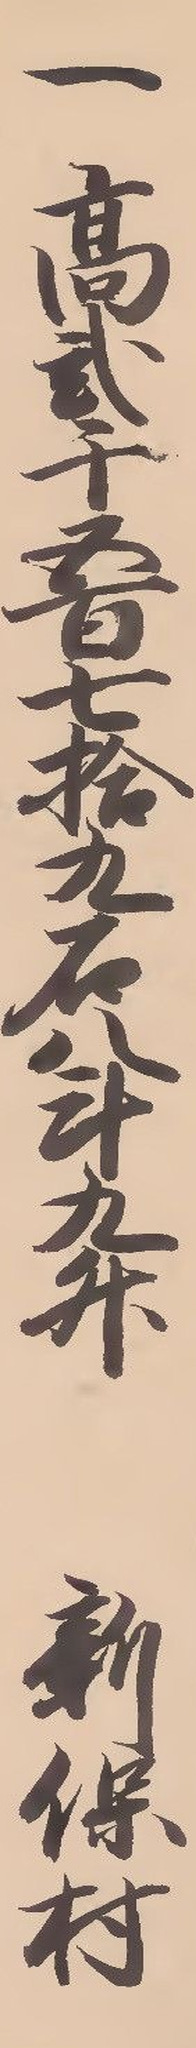一高弐千五百七拾九石八斗九升新保村
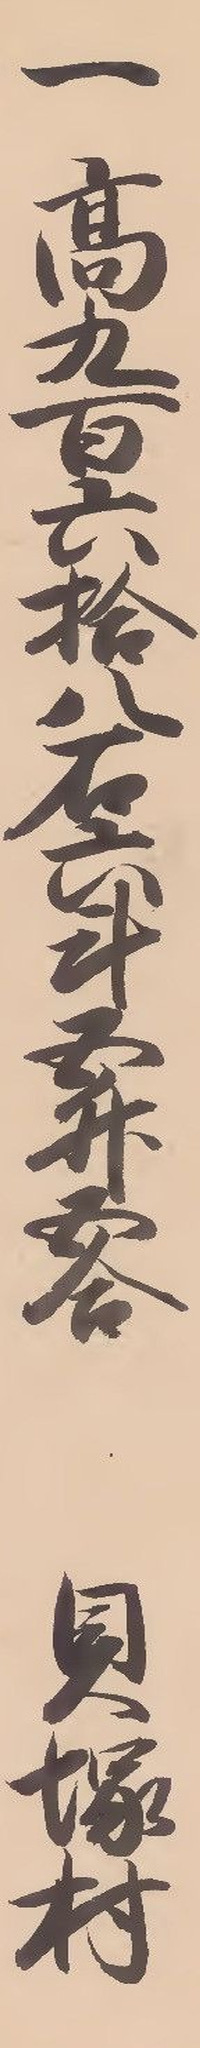一高九百六拾八石六斗五升五合貝塚村
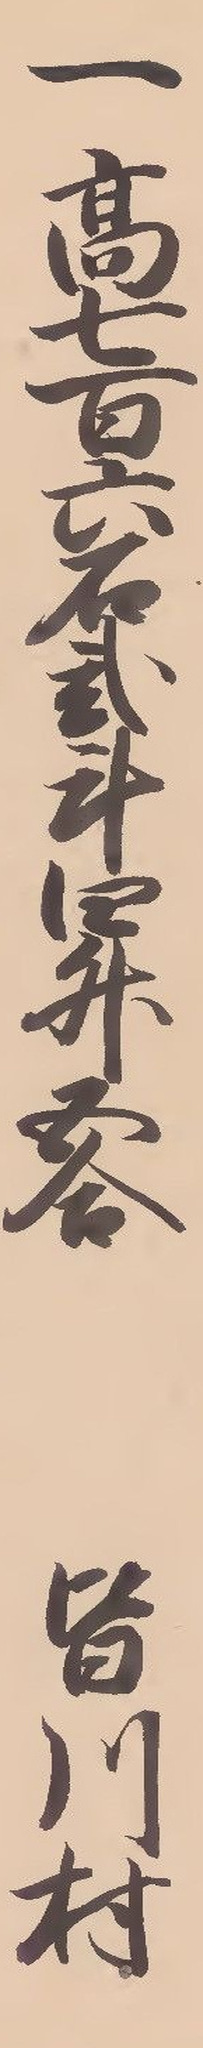一高七百六石弐斗四升五合皆川村
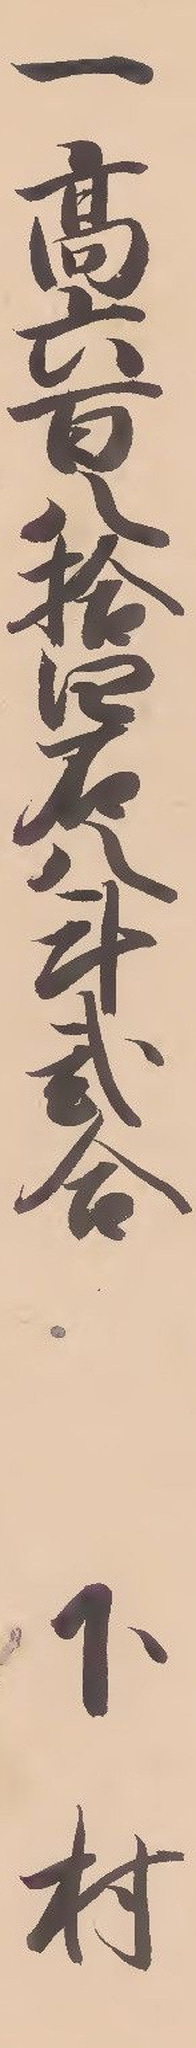一高六百八拾四石八斗弐合下村

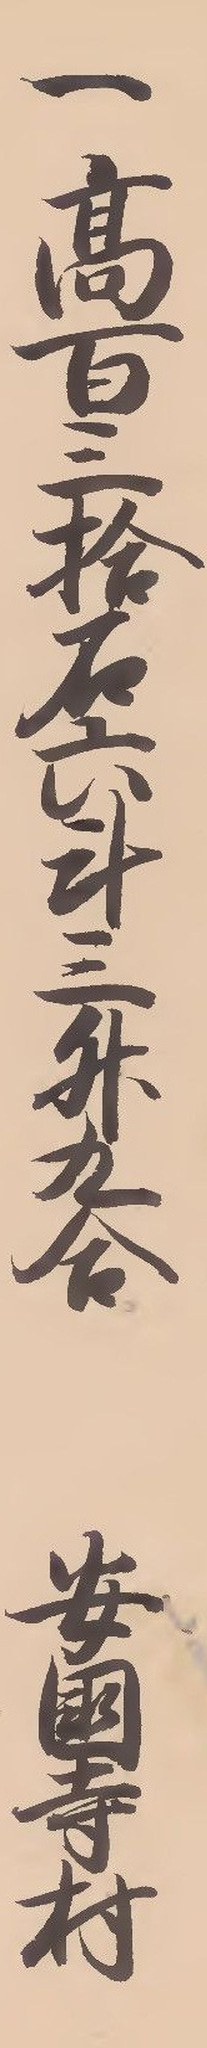一高百三拾石六斗三升九合安国寺村
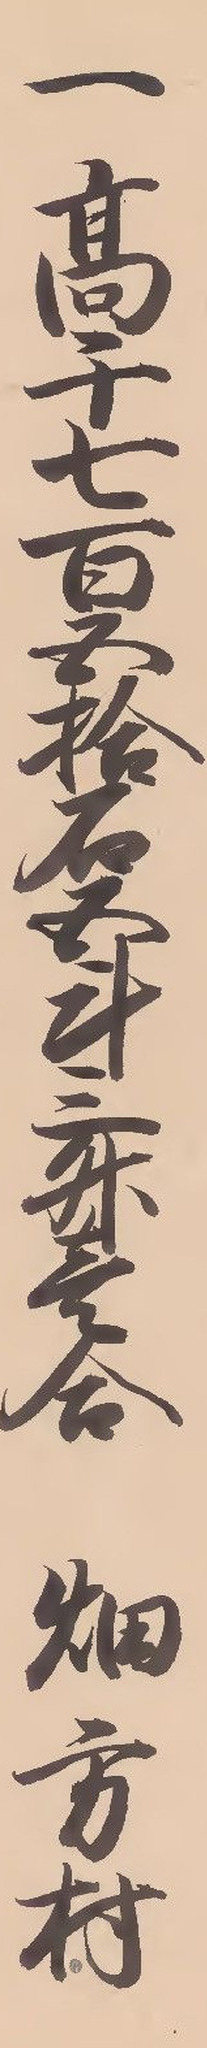一高千七百五拾石五斗三升壱合畑方村
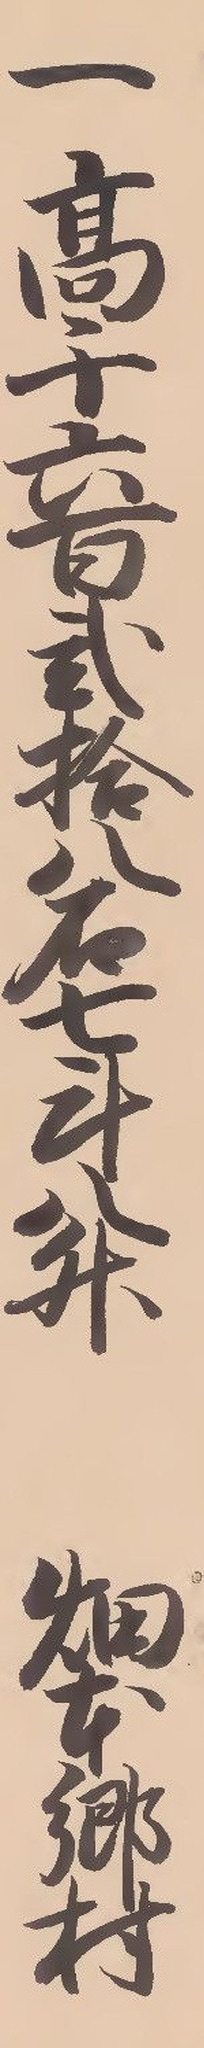一高千六百弐拾八石七斗八升畑本郷村
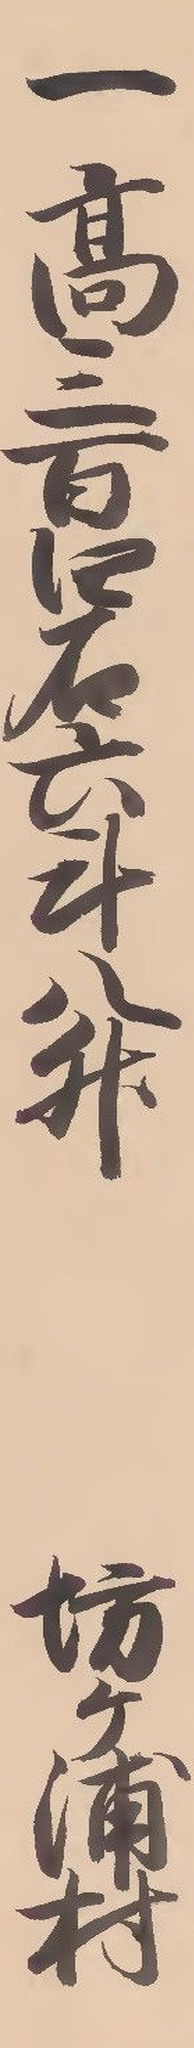一高三百四石六斗八升坊ヶ浦村
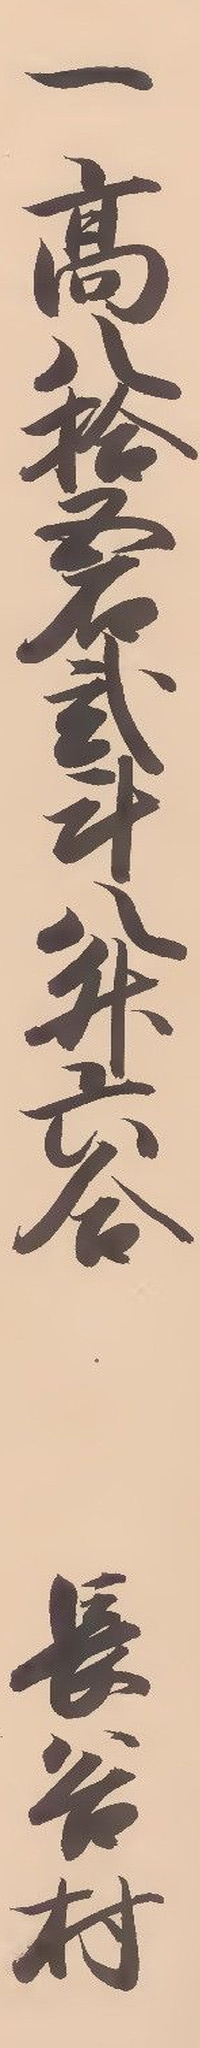一高八拾五石弐斗八升六合長谷村
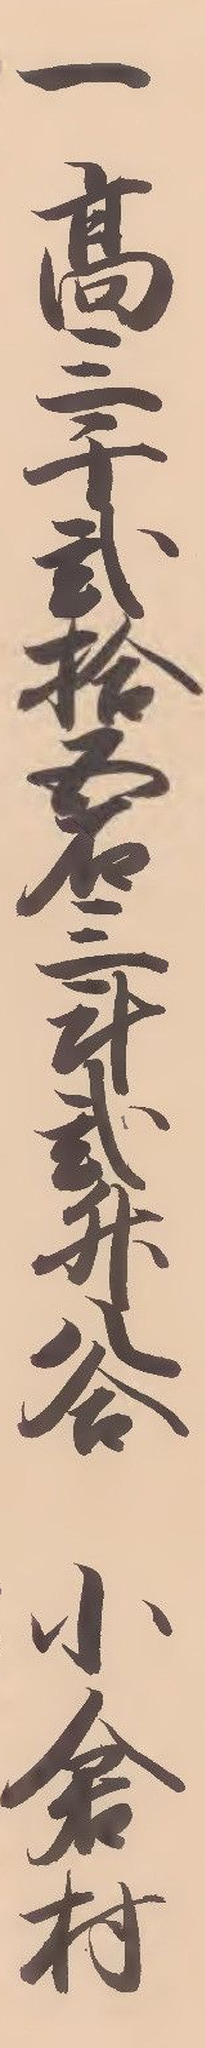一高三千弐拾五石三斗弐升八合小倉村
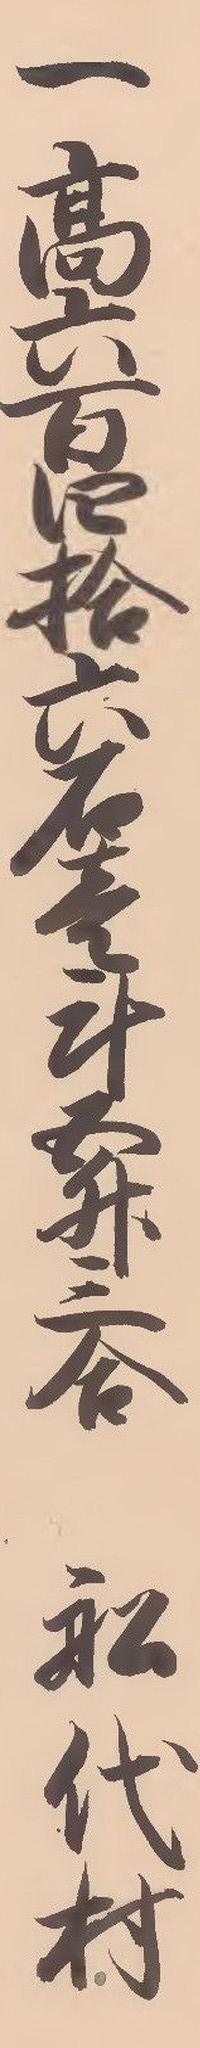一高六百四拾六石壱斗五升三合船代村
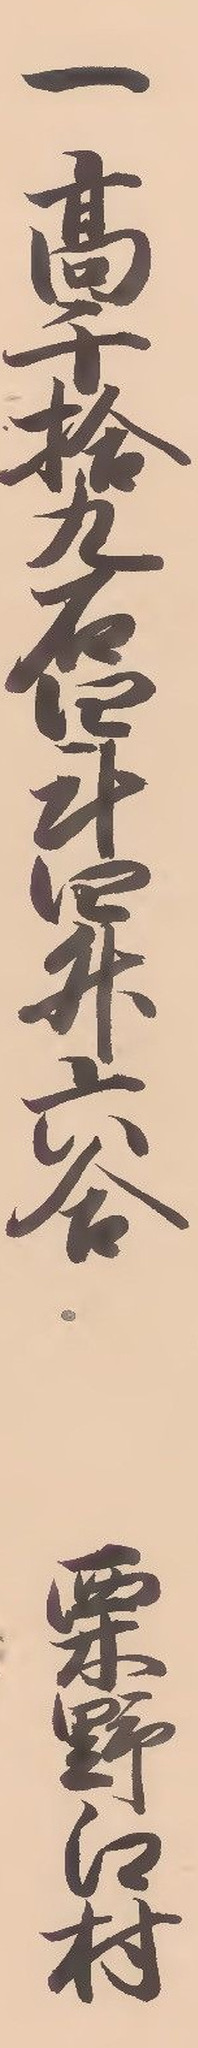一高千拾九石四斗四升六合栗野江村

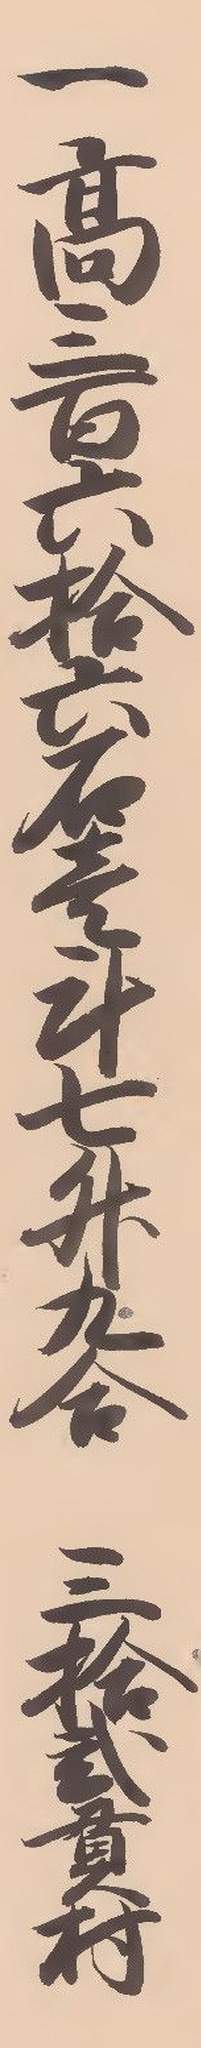一高三百六拾六石壱斗七升九合三拾弐貫村
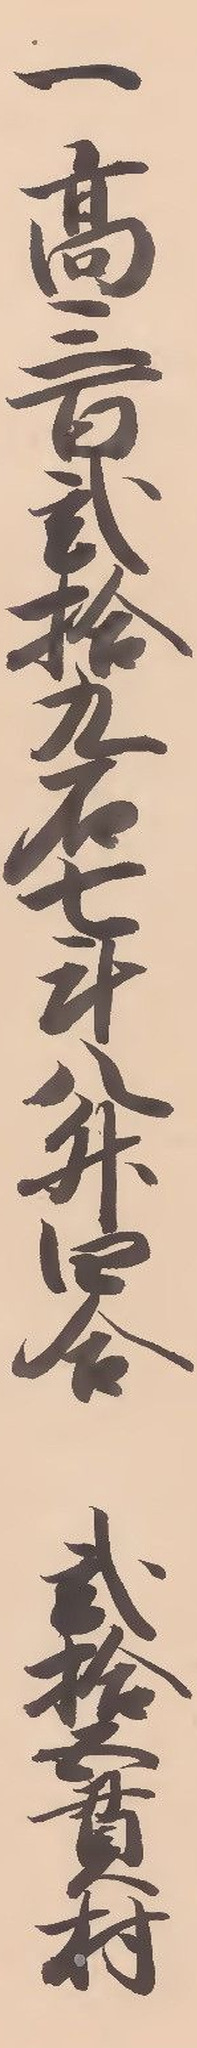一高三百弐拾九石七斗八升四合弐拾五貫村
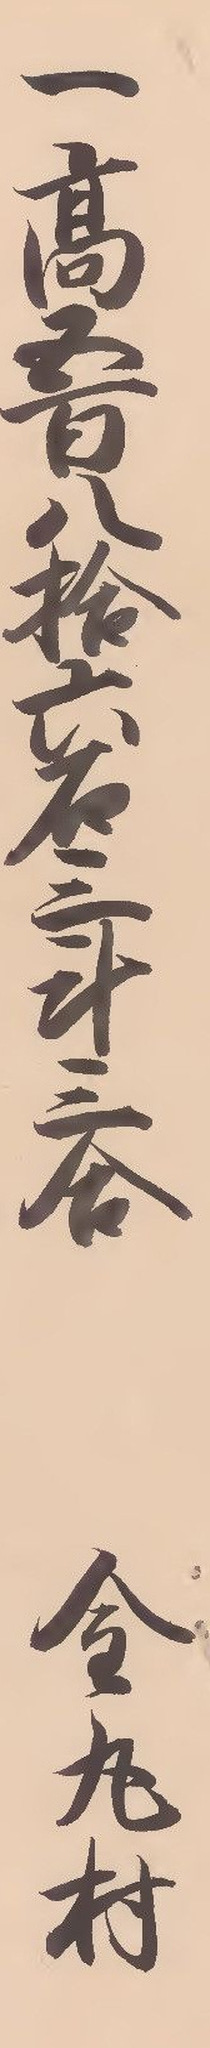一高五百八拾六石三斗三合金丸村
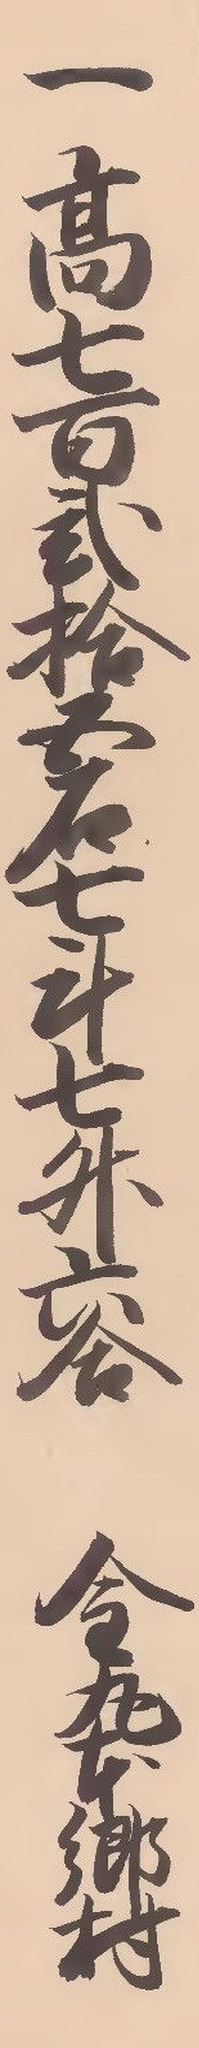一高七百弐拾五石七斗七升六合金丸本郷村
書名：佐渡国郷帳
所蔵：国立公文書館 National Archives of Japan
